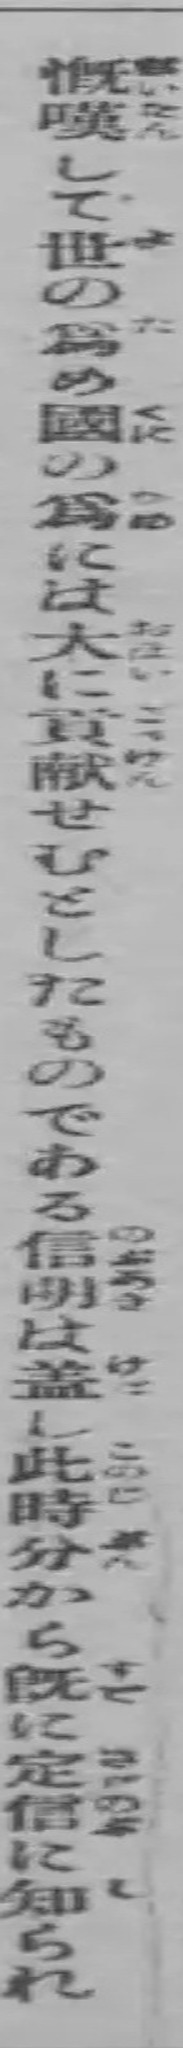定信と信明慨嘆して世の為め国の為には大に貢献せむとしたものである信明は蓋し此時分から既に定信に知られ
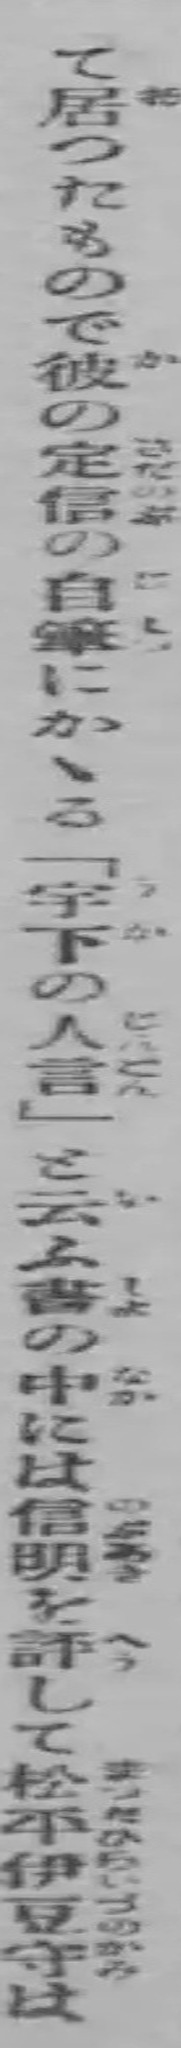て居つたもので彼の定信の自筆にかゝる「宇下の人言」と云ふ書の中には信明を評して松平伊豆守は
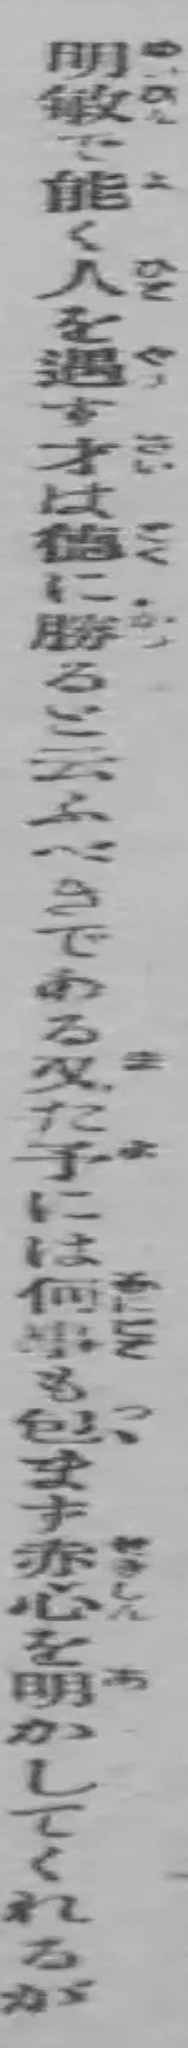明敏で能く人を遇す才は徳に勝ると云ふべきである又た予には何事も包まず赤心を明かしてくれるが
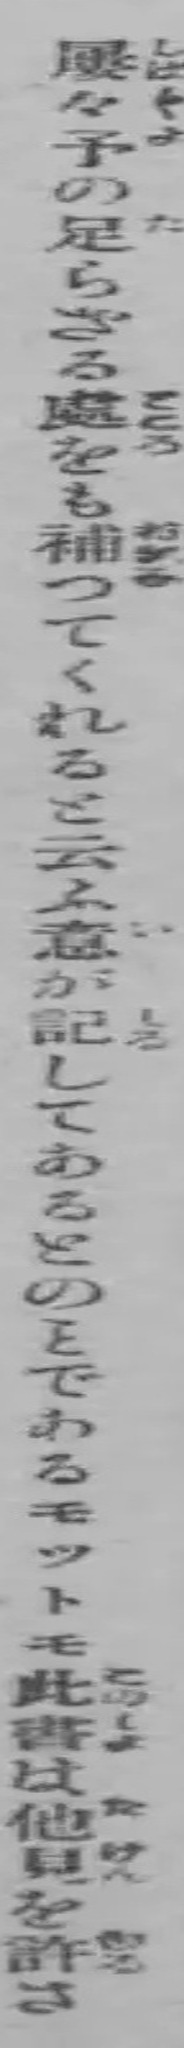屡々予の足らざる処をも補つてくれると云ふ意が記してあるとのことであるモツトモ此書は他見を許さ
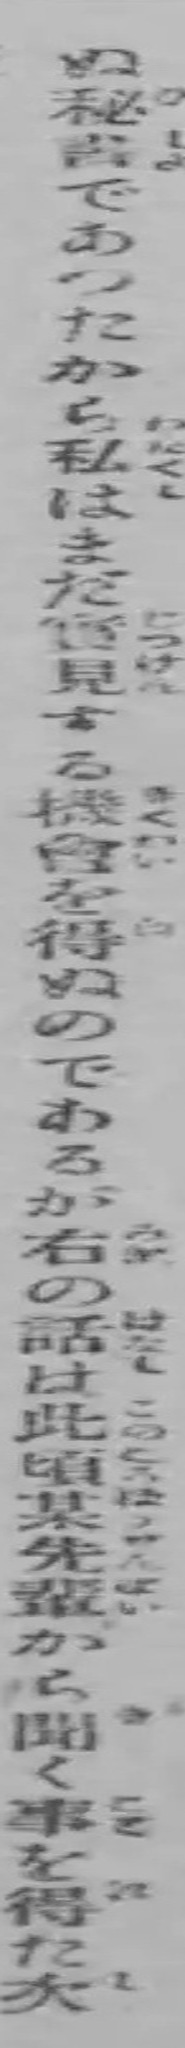ぬ秘書であつたから私はまだ実見する機会を得ぬのであるが右の話は此頃某先輩から聞く事を得た次
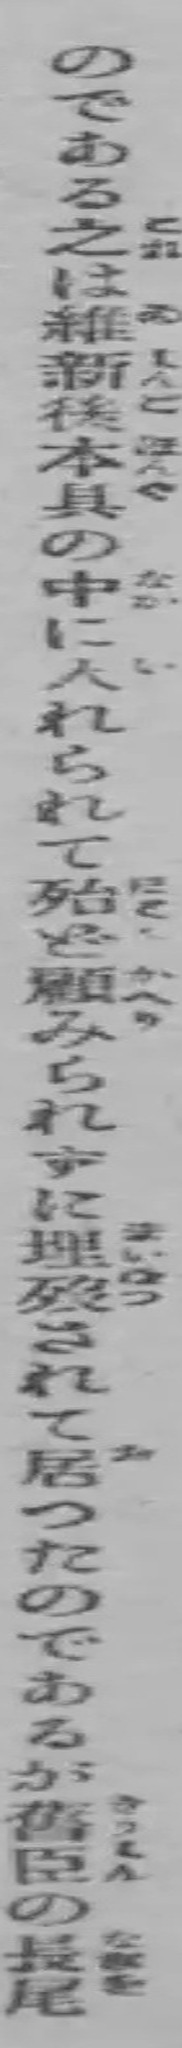のである之は維新後本具の中に入れられて殆ど顧みられずに埋没されて居つたのであるが旧臣の長尾
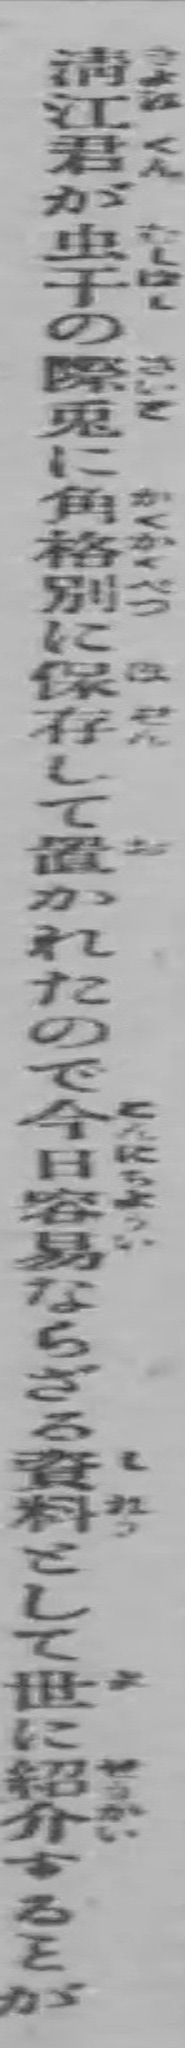清江君が虫干の際兎に角格別に保存して置かれたので今日容易ならざる資料として世に紹介することが
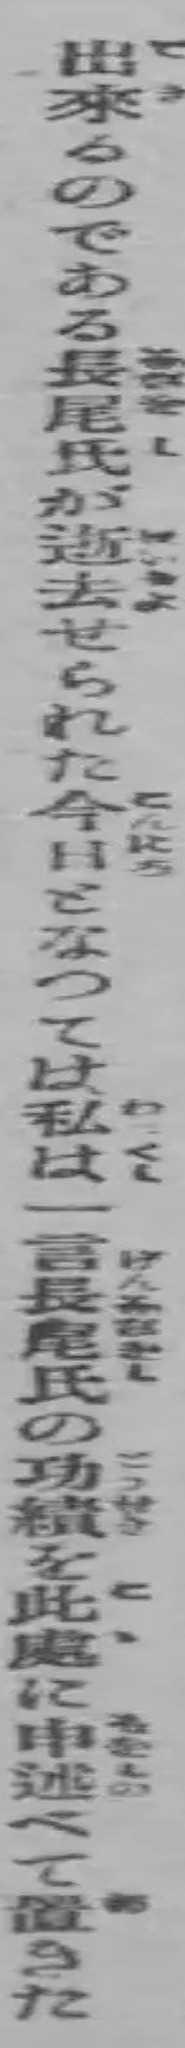出来るのである長尾氏が逝去せられた今日となつては私は一言長尾氏の功績を此処に申述べて置きた
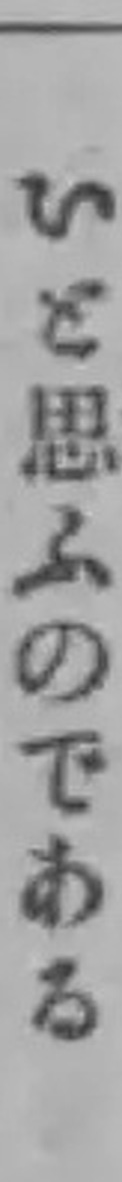いと思ふのである

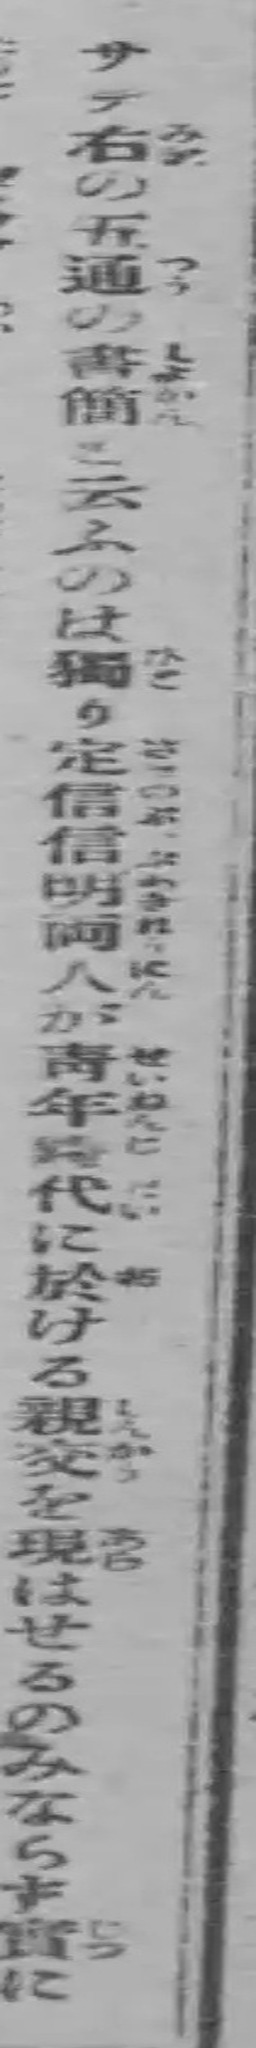サテ右の五通の書簡と云ふのは独り定信信明両人が青年時代に於ける親交を現はせるのみならず実に
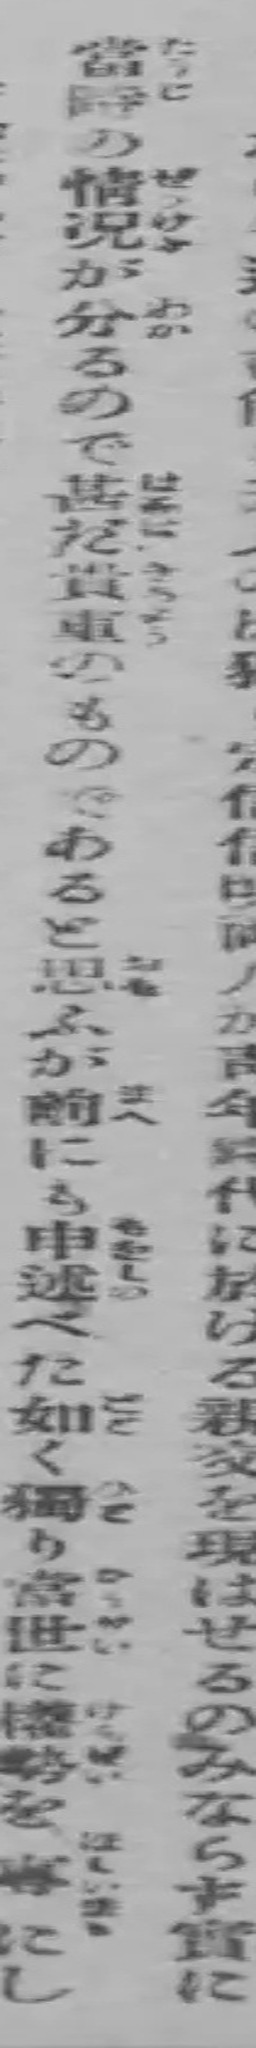当時の情況が分るので甚だ貴重のものであると思ふが前にも申述べた如く独り当世に権勢を専にし
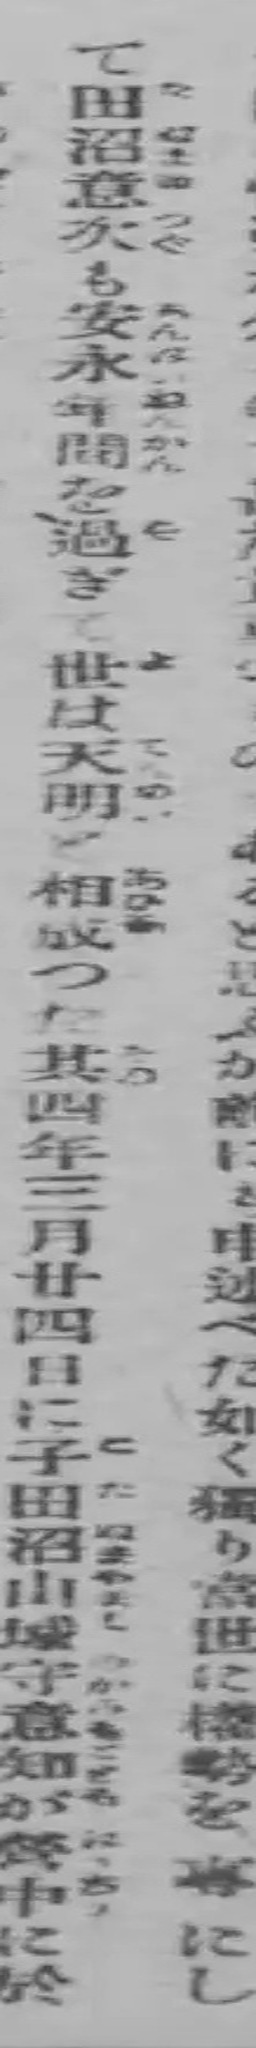て田沼意次も安永年間を過ぎて世は天明と相成つた其四年三月廿四日に子田沼山城守意知が営中に於
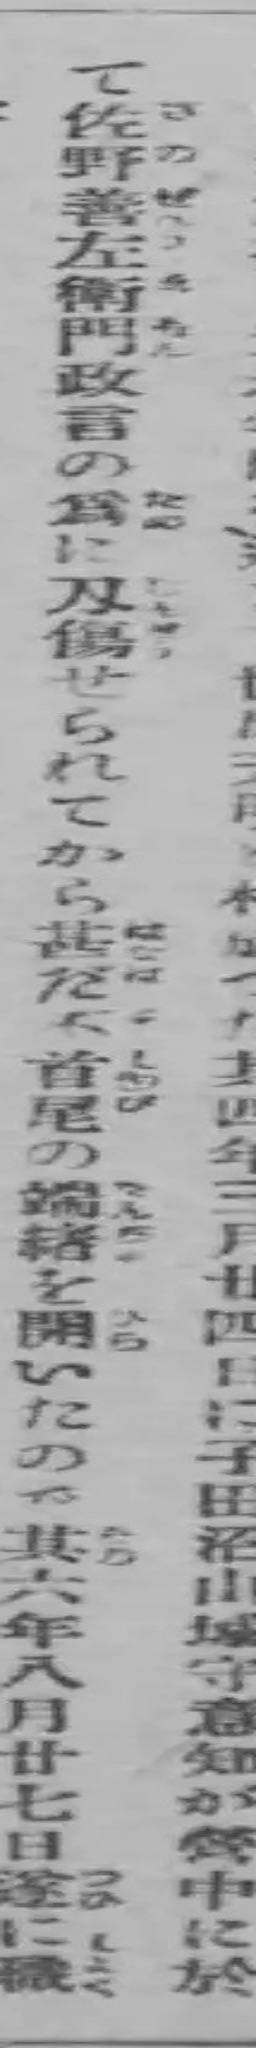意次の解職て佐野善左衛門政言の為に刃傷せられてから甚だ不首尾の端緒を開いたので其六年八月廿七日遂に職
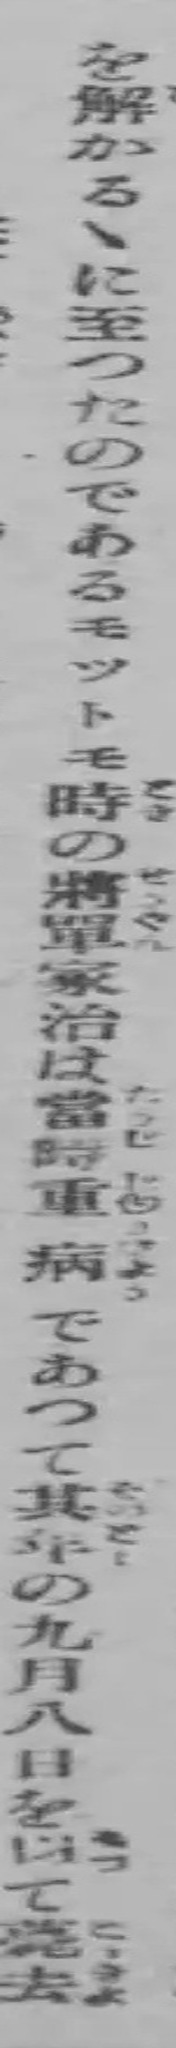を解かるゝに至つたのであるモツトモ時の将軍家治は当時重病であつて其年の九月八日を以て薨去
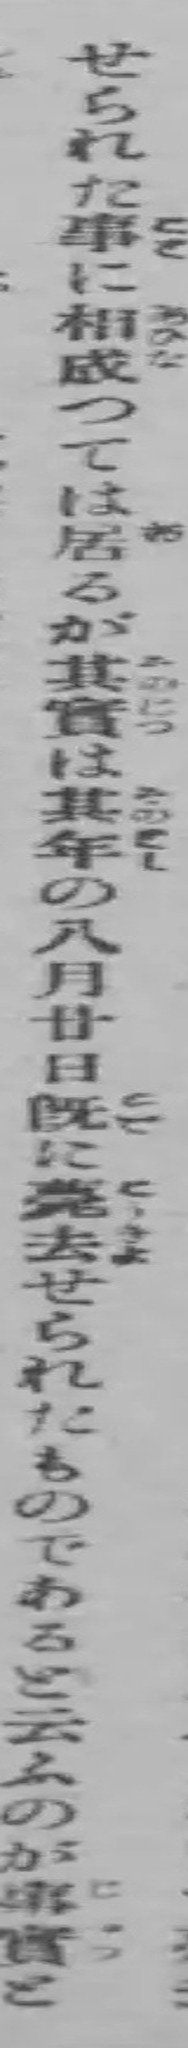せられた事に相成つては居るが其実は其年の八月廿日既に薨去せられたものであると云ふのが事実と
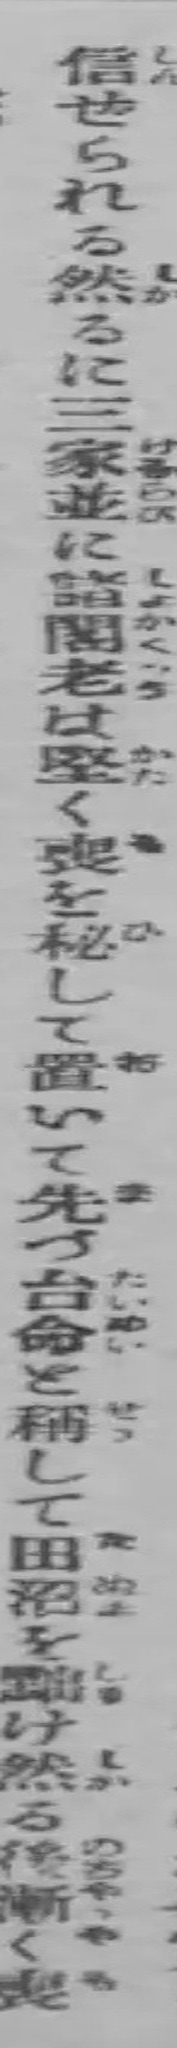信ぜられる然るに三家並に諸閣老は堅く喪を秘して置いて先づ台命と称して田沼を黜け然る後漸く喪
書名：豊橋市史談
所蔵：国立国会図書館 National Diet Library, JAPAN
